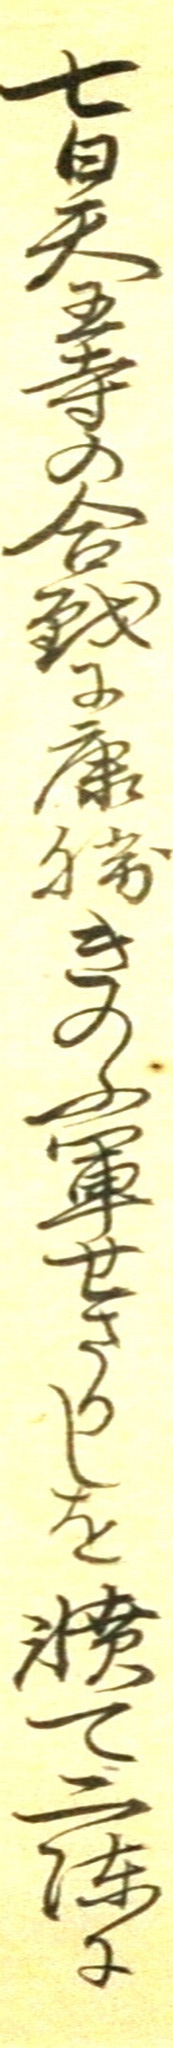七日天王寺の合戦に康勝きのふ軍せさりしを憤て二陣に
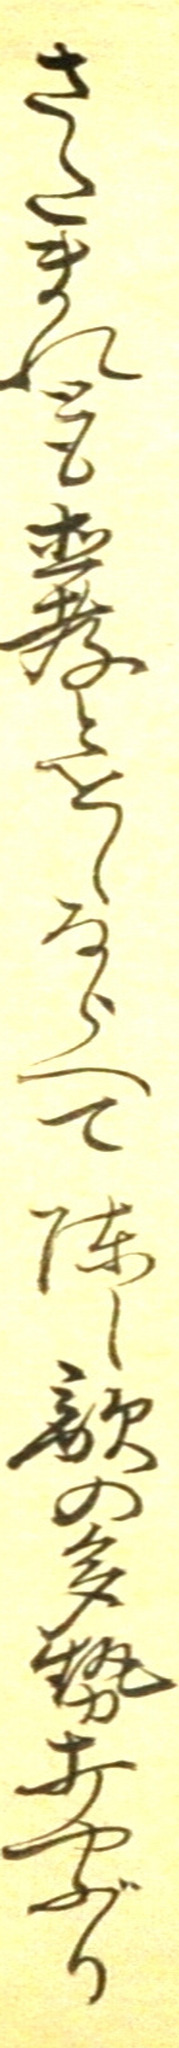さたまれとも直孝とをしならへて陣し敵の多勢打やぶり
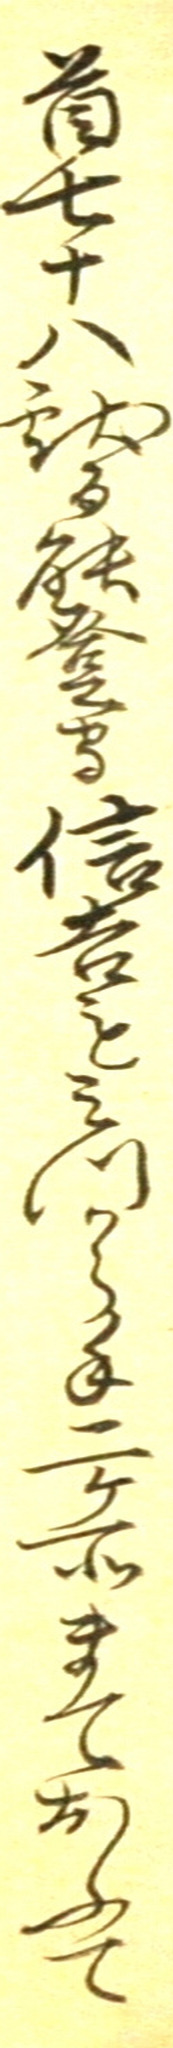首七十八献る能登守信吉もみつから手二ヶ所まておふて
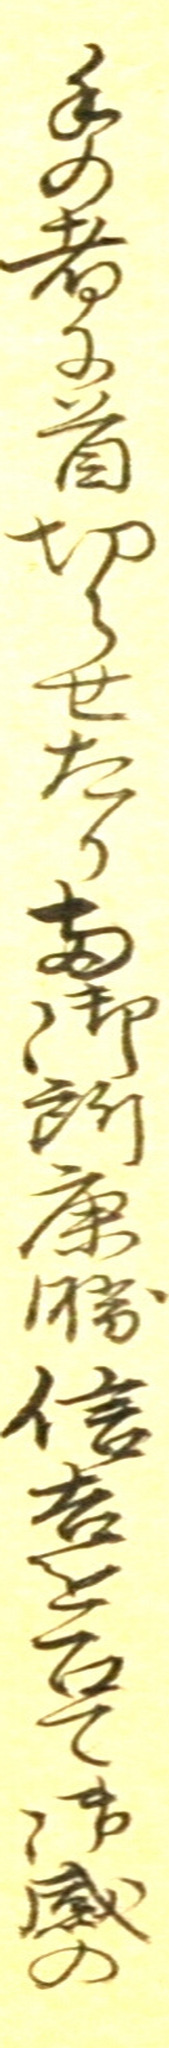手の者に首切らせたり両御所康勝信吉を召て御感の

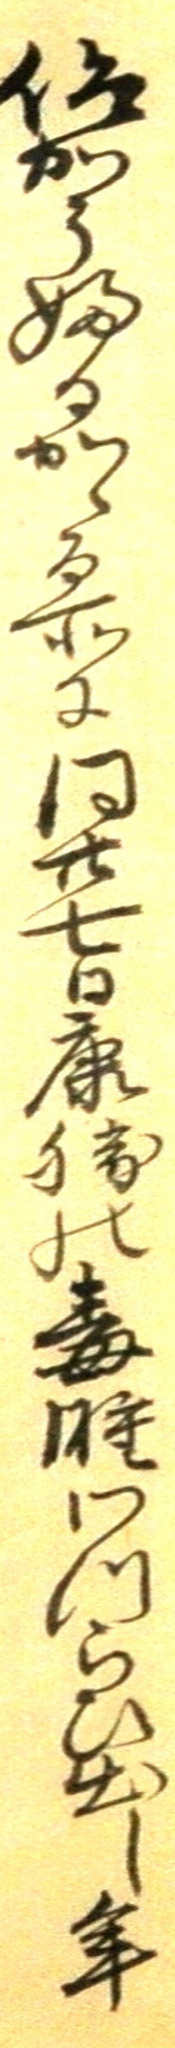仰かうふるかゝる所に同廿七日康勝の毒腫わつらひ出し年
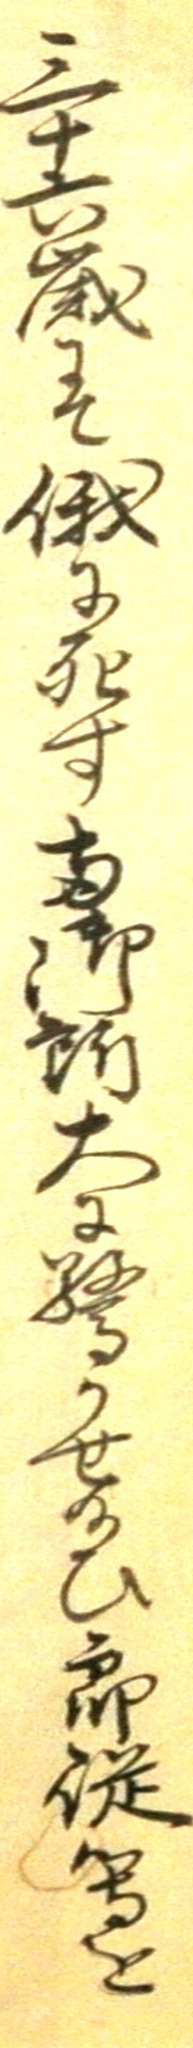三十六歳にて俄に死す両御所大に驚かせ給ひ郎従等を
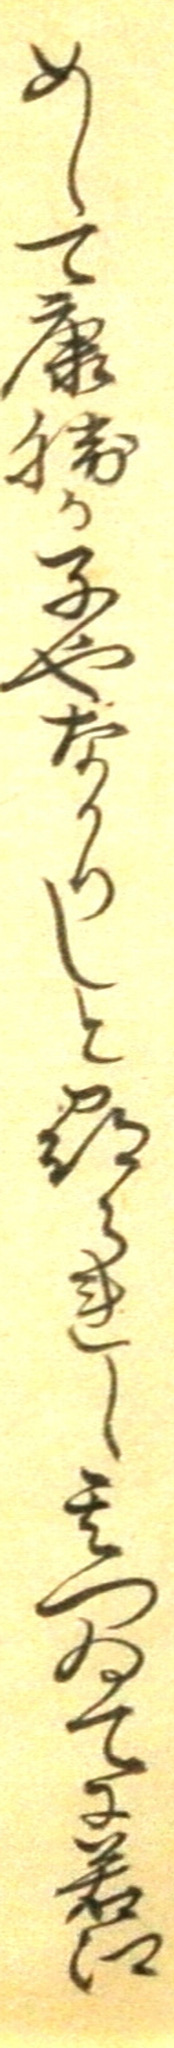めして康勝か子やなかりしと尋られし其つゐてに若江
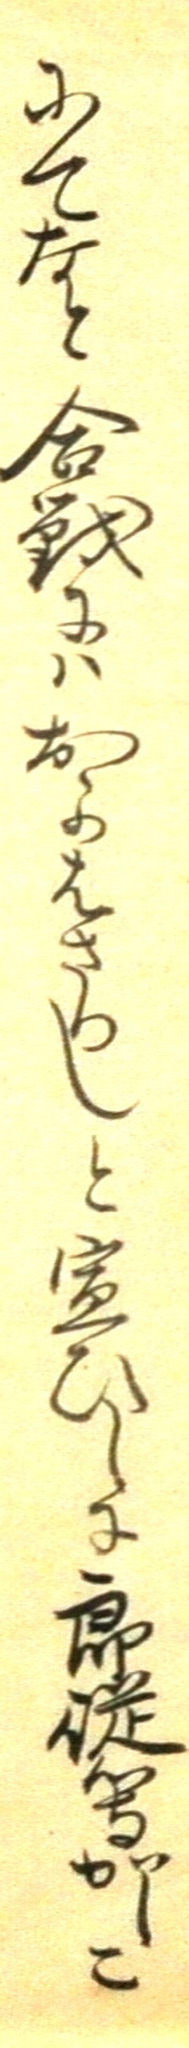にてなと合戦にはおよはさりしと宣ひしに郎従等かしこ
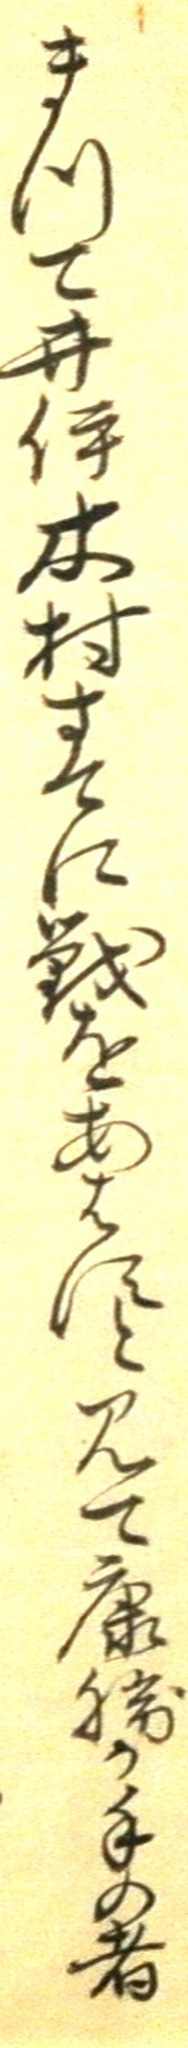まつて井伊木村すてに戦をあはすと見て康勝か手の者
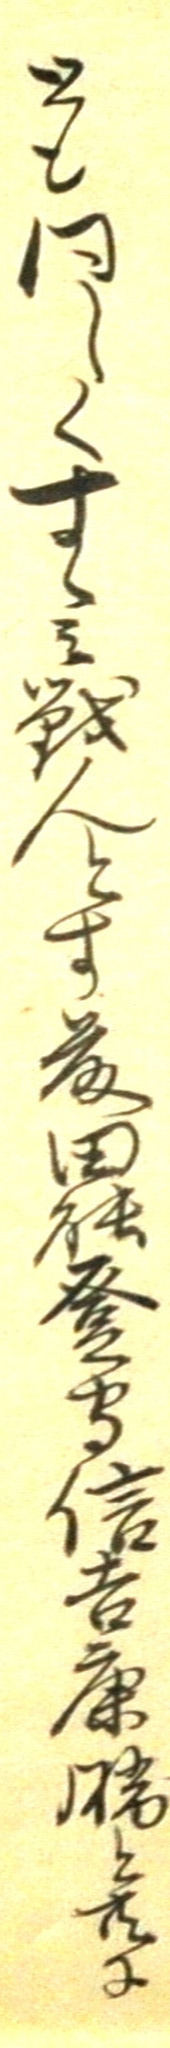とも同しくすゝみ戦んとす藤田能登守信吉康勝と共に
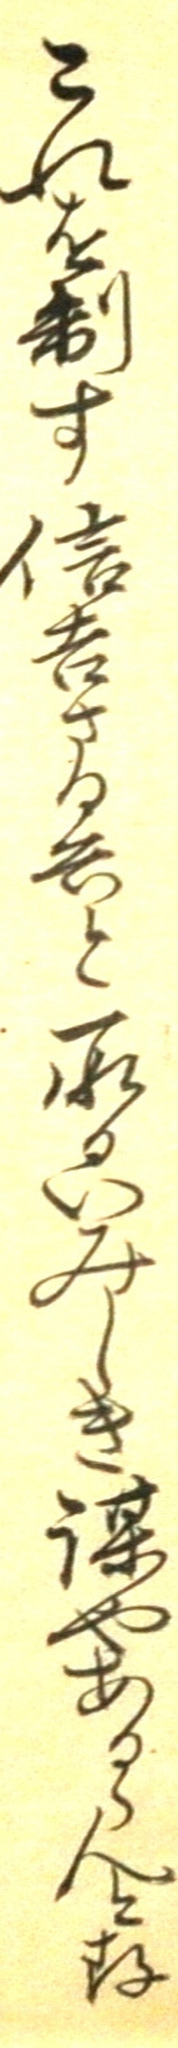これを制す信吉さる兵と承るいみしき謀やあるらんと存
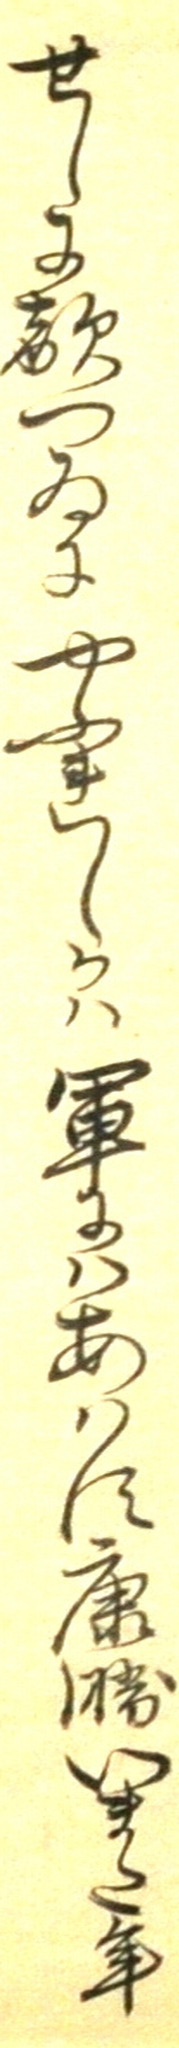せしに敵つゐにやふれしかは軍にはあはす康勝いまた年
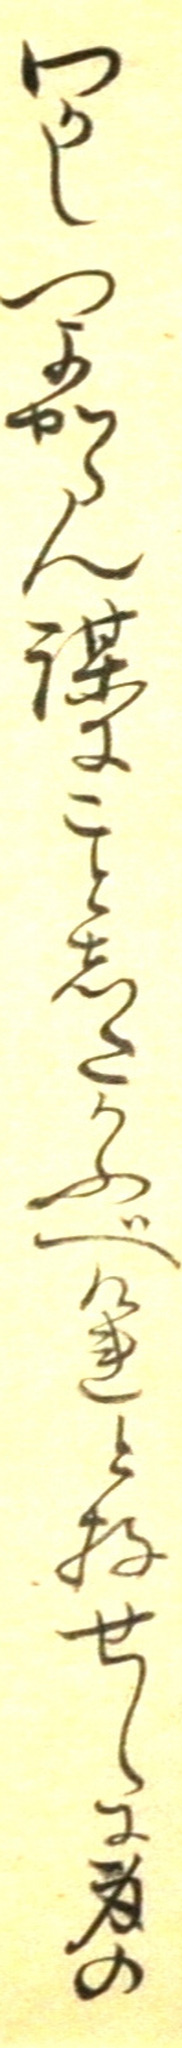わかしつよからん謀にことしたかふべけれと存せしに身の
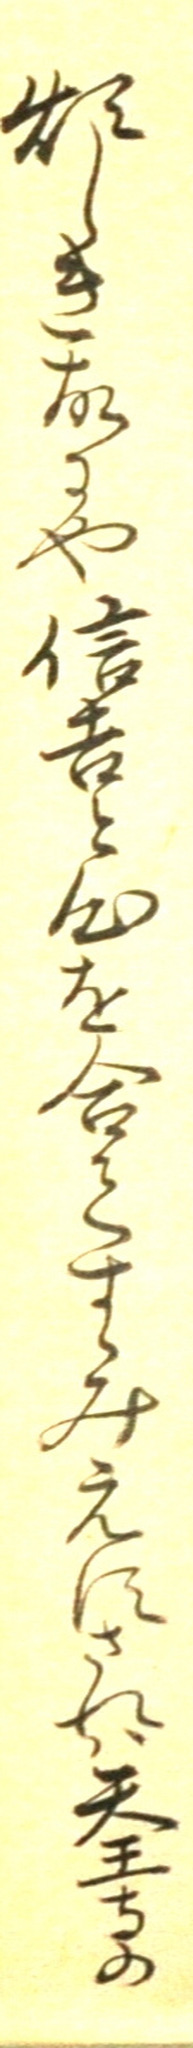煩しき故にや信吉と心を合てすゝみえすされは天王寺の
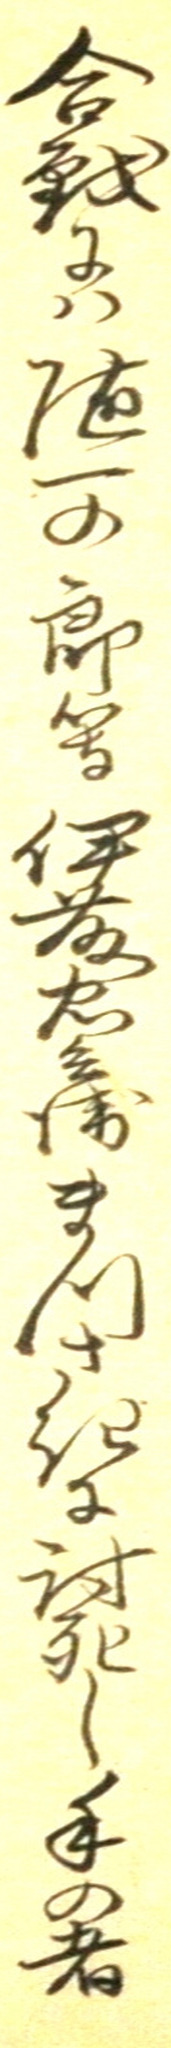合戦には随一の郎等伊藤忠兵衛まつさきに討死し手の者
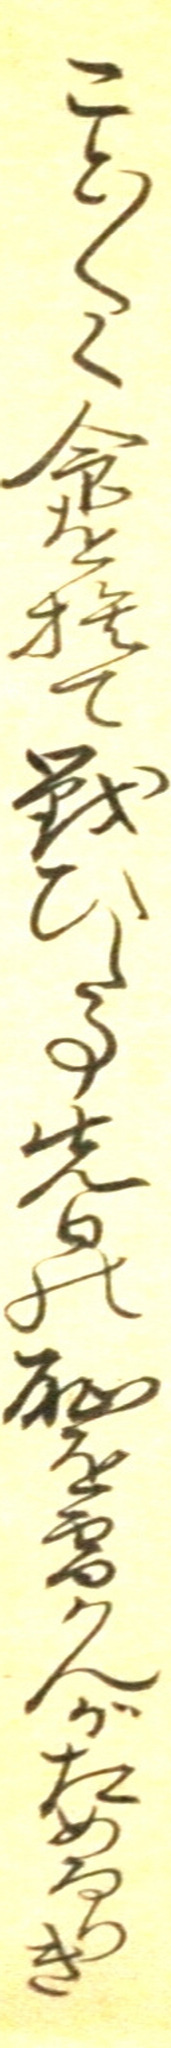こと〳〵く命を捨て戦ひし事先日の恥を雪かんがためなりき
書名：藩翰譜（四・上）
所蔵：伊那市立高遠町図書館・合同会社AMANE
